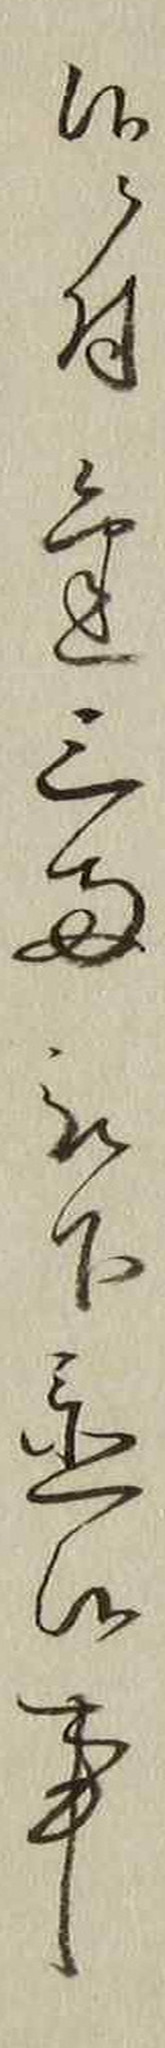候ニ付金三両被下置候事
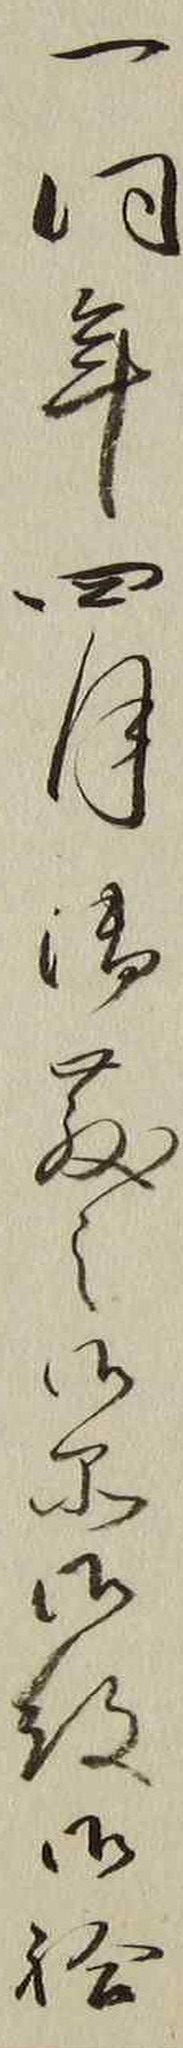一同年四月御散之御品御紋御袷
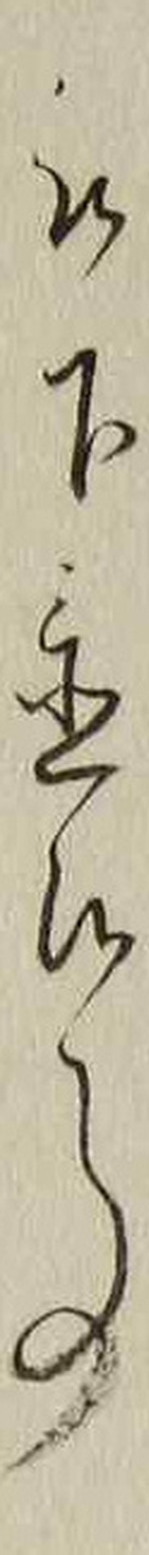被下置候事
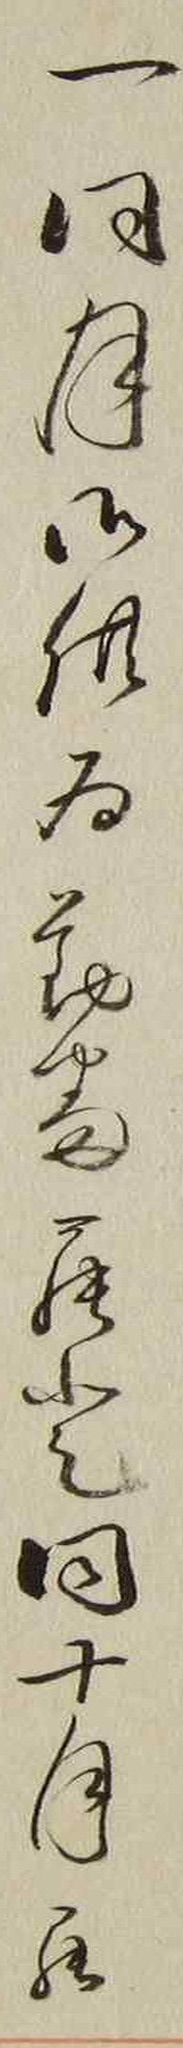一同月御供為勤番罷登同十月罷
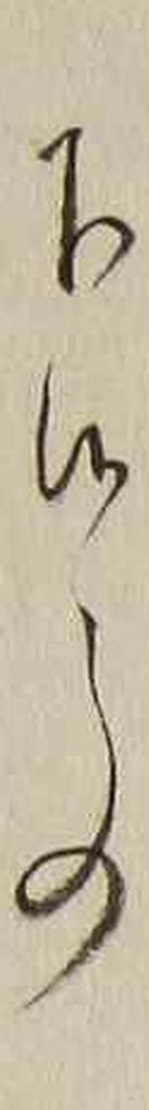下候事
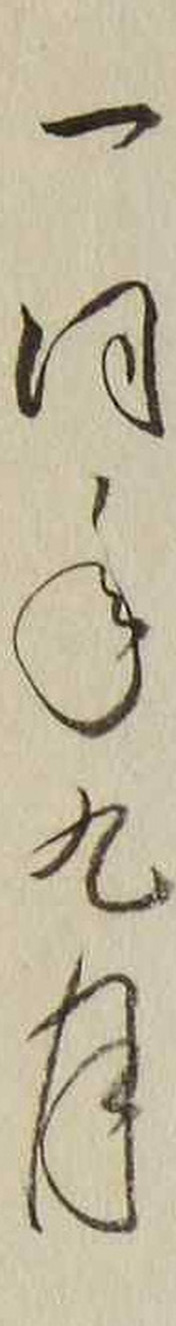一同年九月

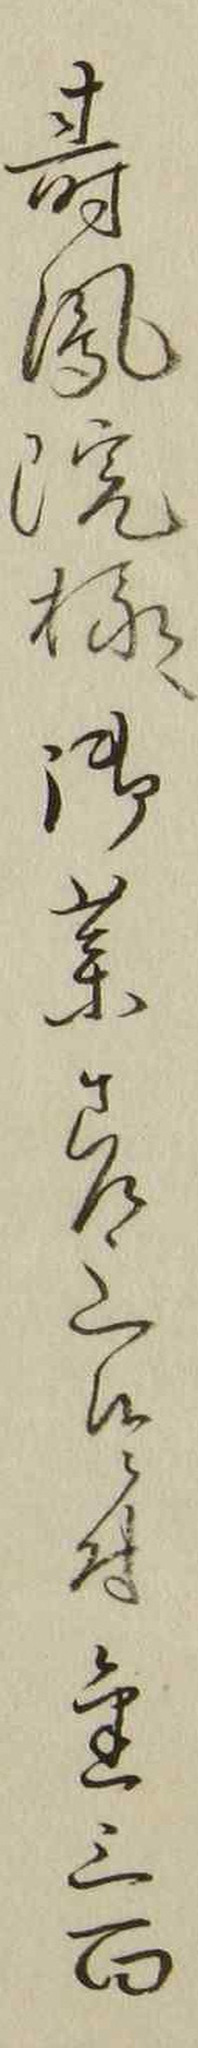寿鳳院様御薬差上候ニ付金三百
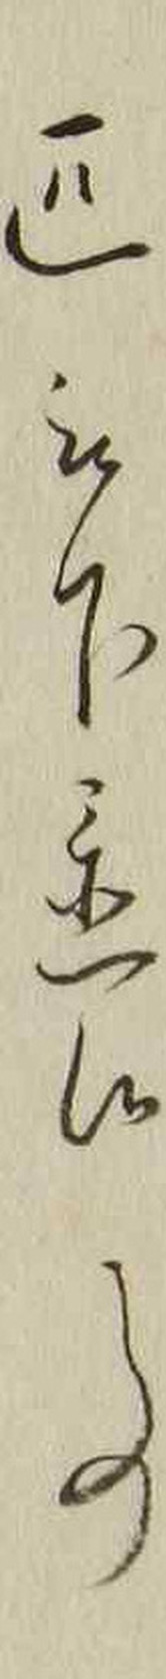匹被下置候事
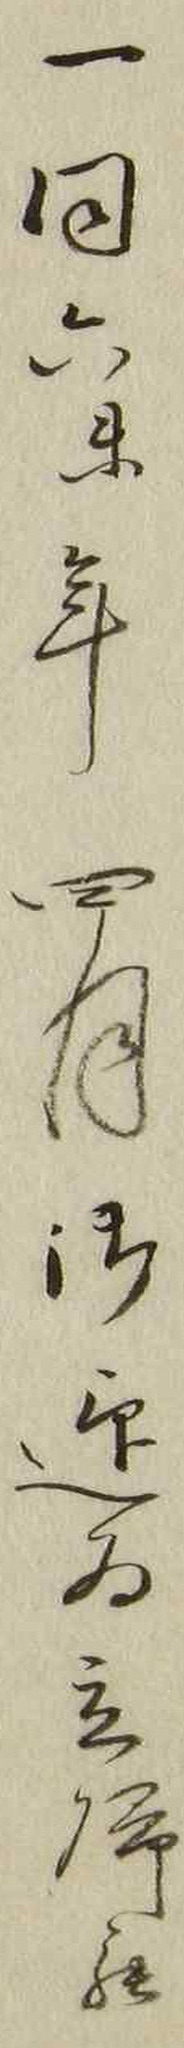一同六未年四月御迎為立帰罷
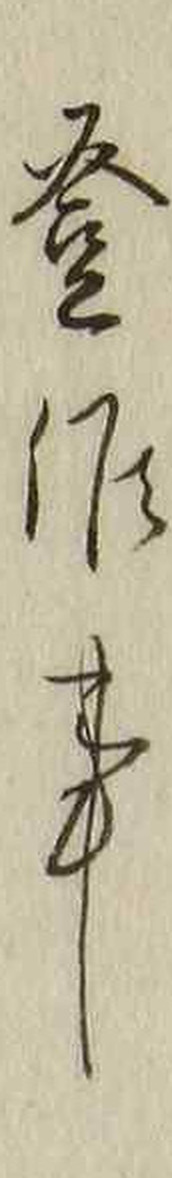登候事
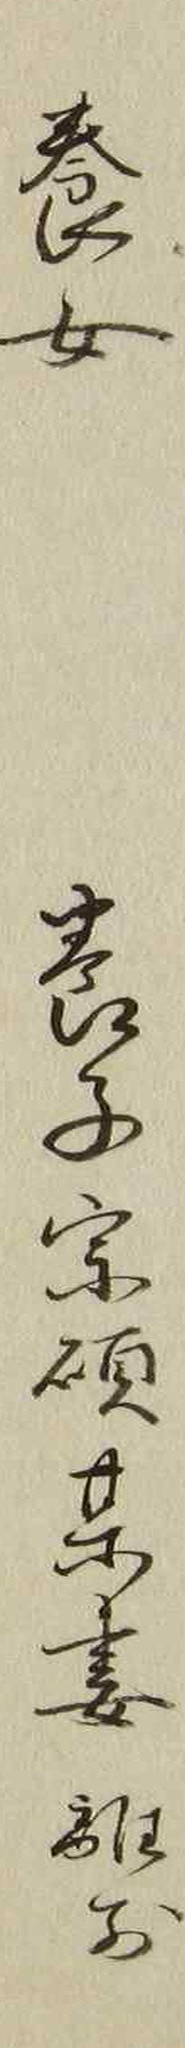養女養子宗硯某妻離別
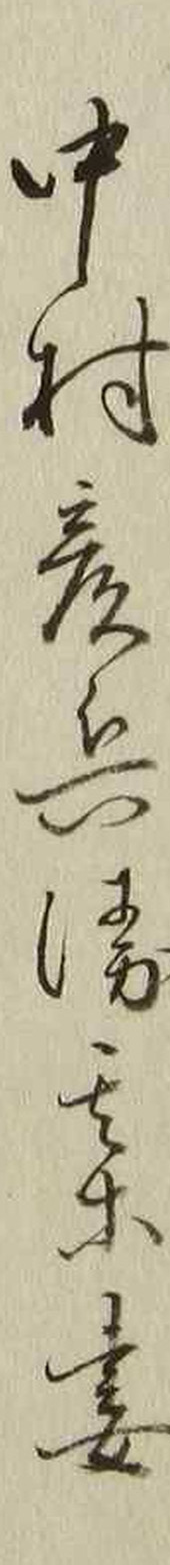中村彦兵衛某妻
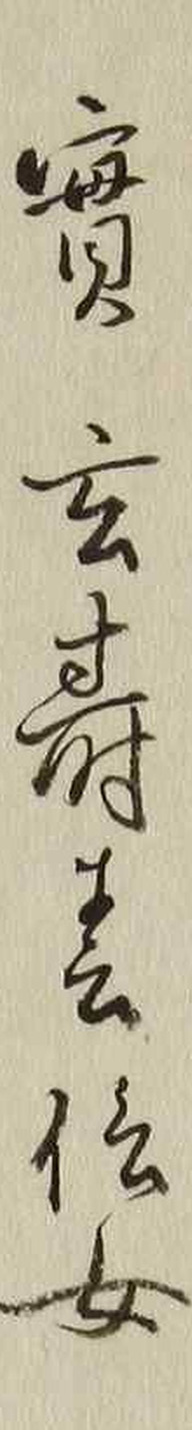実玄寿春信女
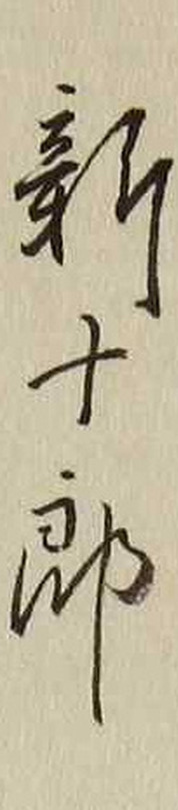新十郎
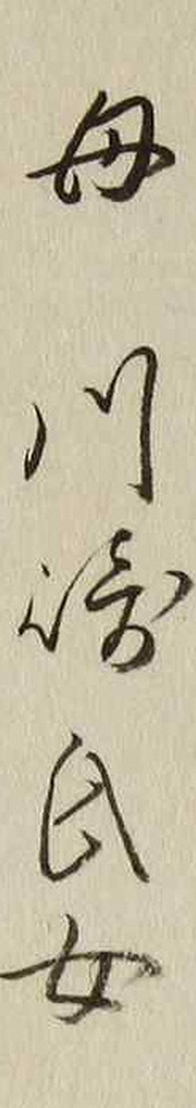母川崎氏女
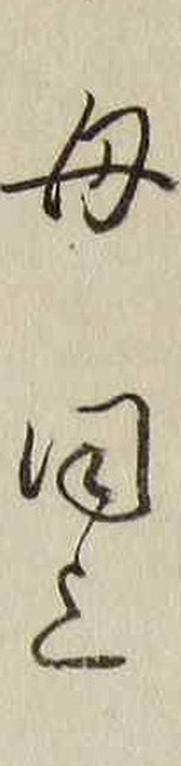母同上
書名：諸士系譜　巻之8　い之部8
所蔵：会津若松市立会津図書館
